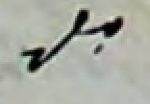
do
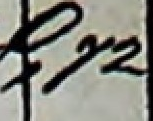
0,72
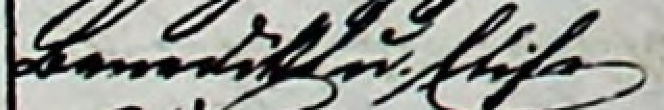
Benedikt u. Elise
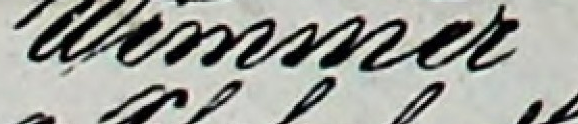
Wimmer
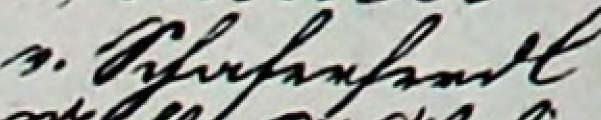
v. Schaferherdl
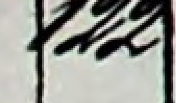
122
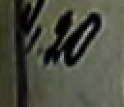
3,20
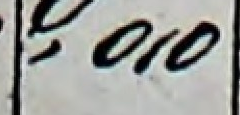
0,010
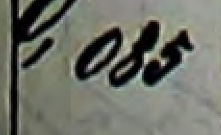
0,085
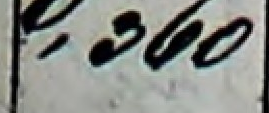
0,360
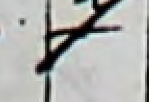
7
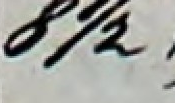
8 ½
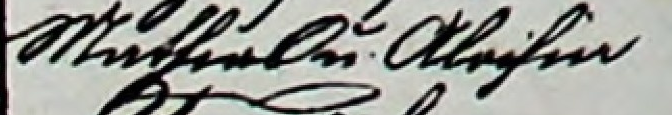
Mathias u. Aloisia
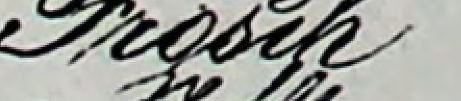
Grosch
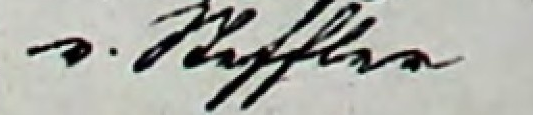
v. Steffler
